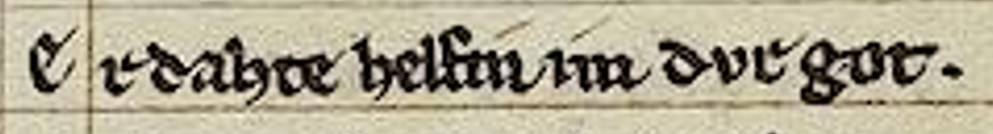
Er dahte helfin im dvr got.
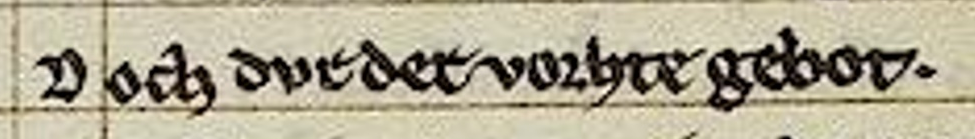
Doch dvr der vorhte gebot.
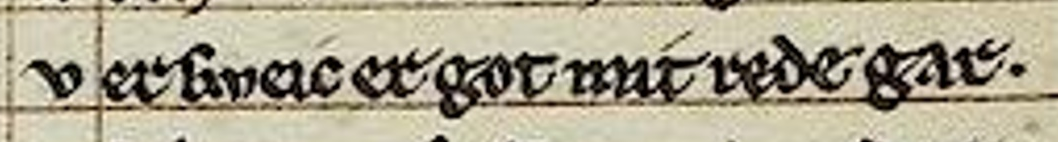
Verſweic er got mit rede gar.
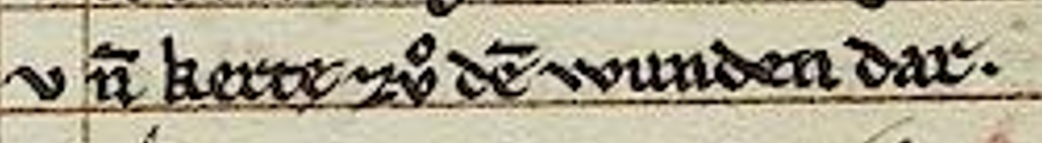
Vn(d) kerte zv°o de(m) wunden dar.
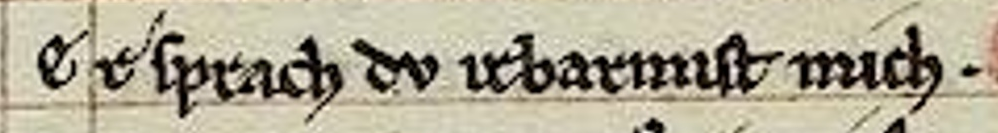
Er ſprach dv irbarmiſt mich.
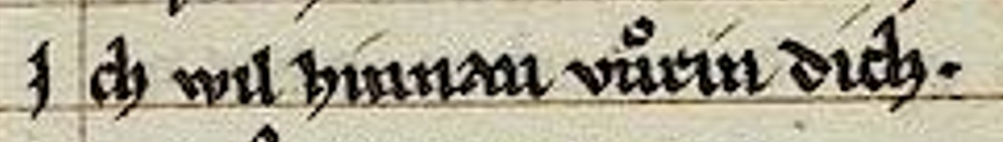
Ich wil hinnan vu°orin dich.
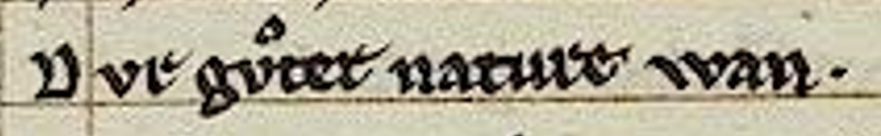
Dvr gv°oter nature wan.
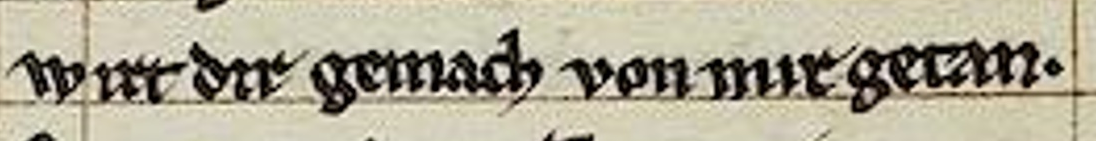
Wirt dir gemach von mir getan.
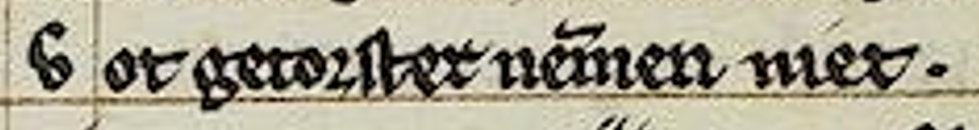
Got getorſter ne(m)men niet.
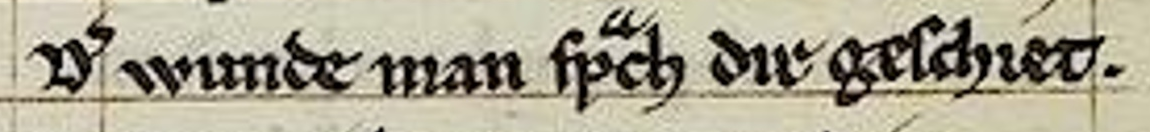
D(er) wunde man sp(ra)ch dir geſchiet.
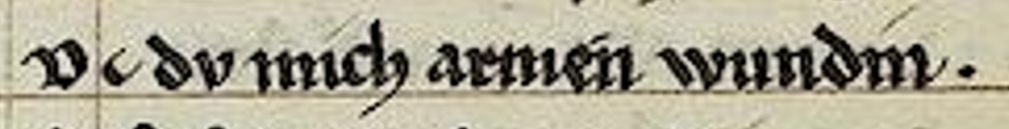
D(az) dv mich armen wundin.
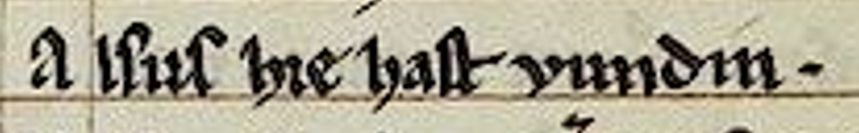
Alſuſ hie haſt vundin.
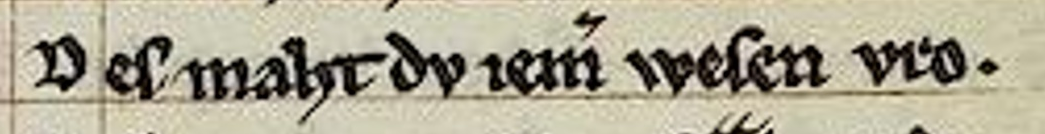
Deſ maht dv iem(er) weſen vro.
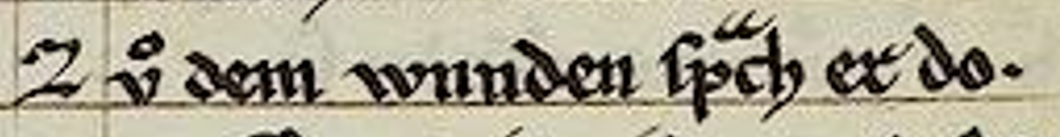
Zv°o dem wunden ſp(ra)ch er do.
